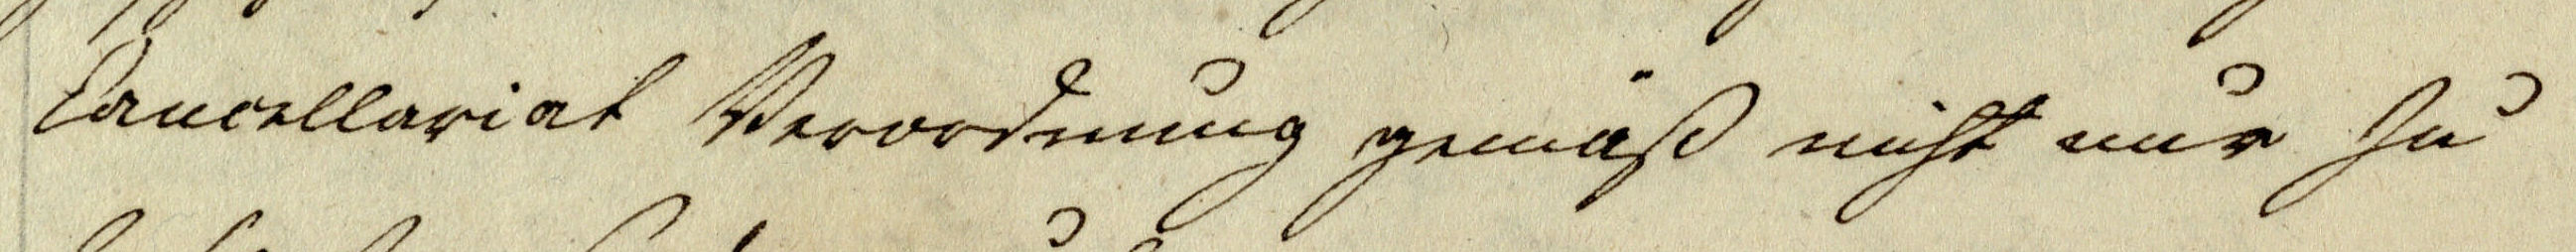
Cancellariat Verordnung gemäß nicht nur zu
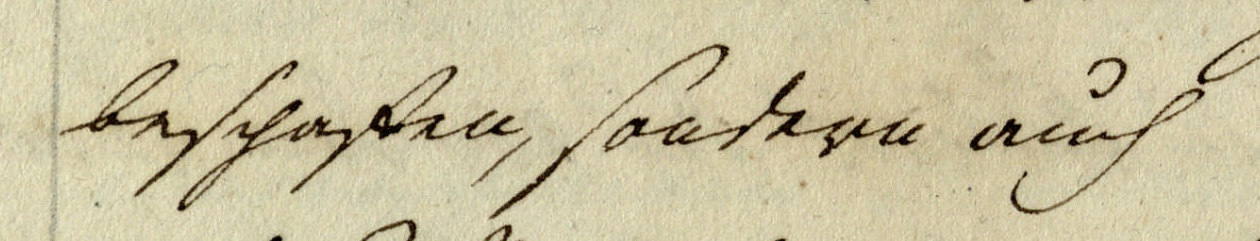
beschaffen, sondern auch
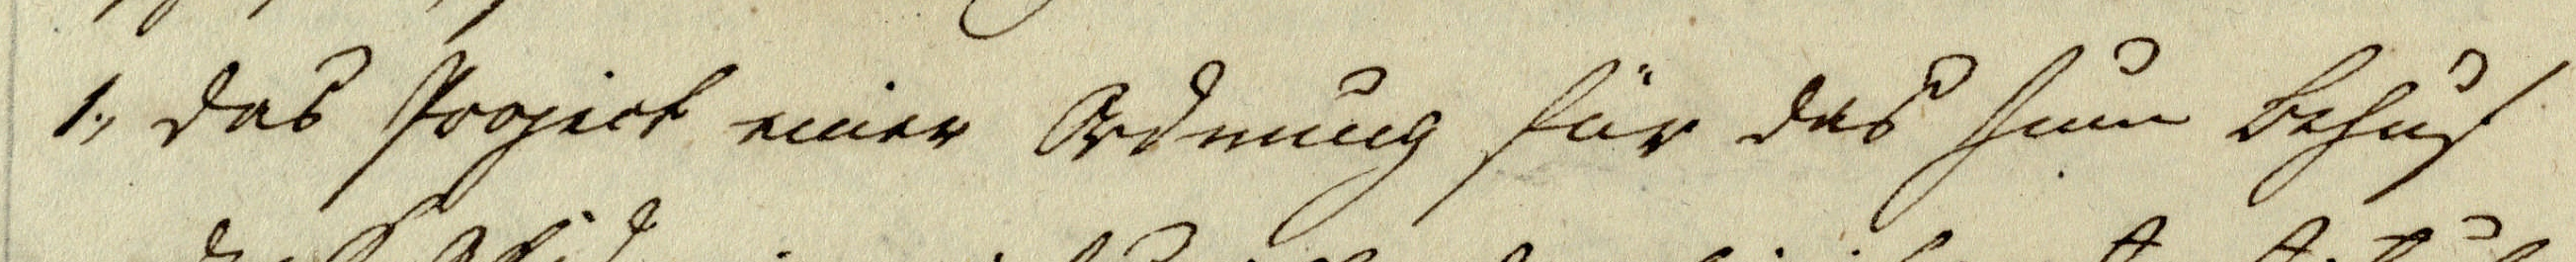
1., das Project einer Ordnung für das zum Behuf
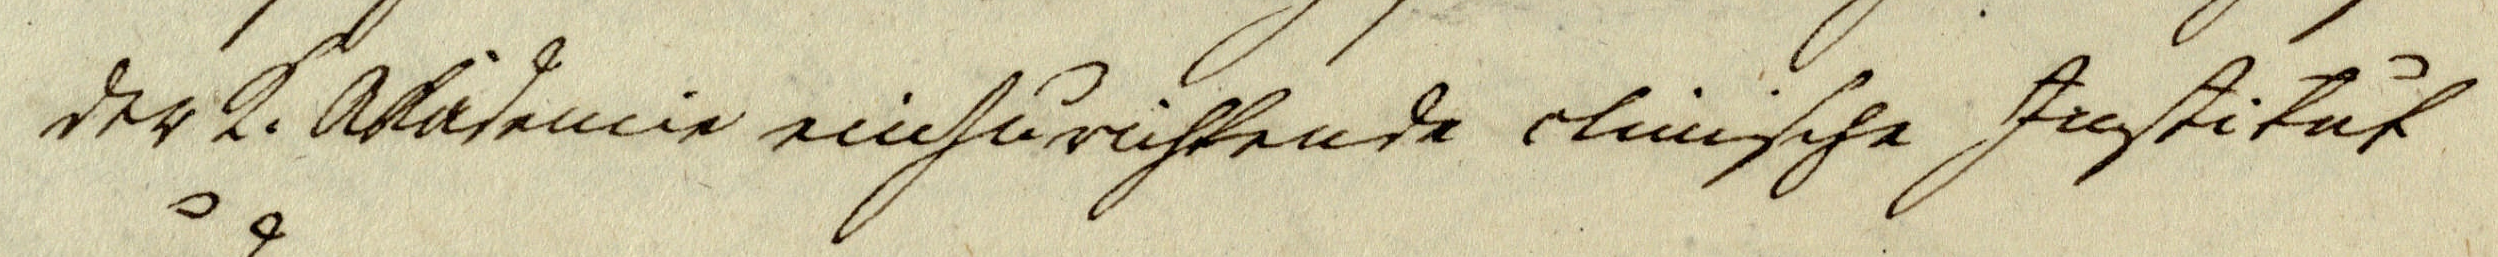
der K. Akademie einzurichtende clinische Institut
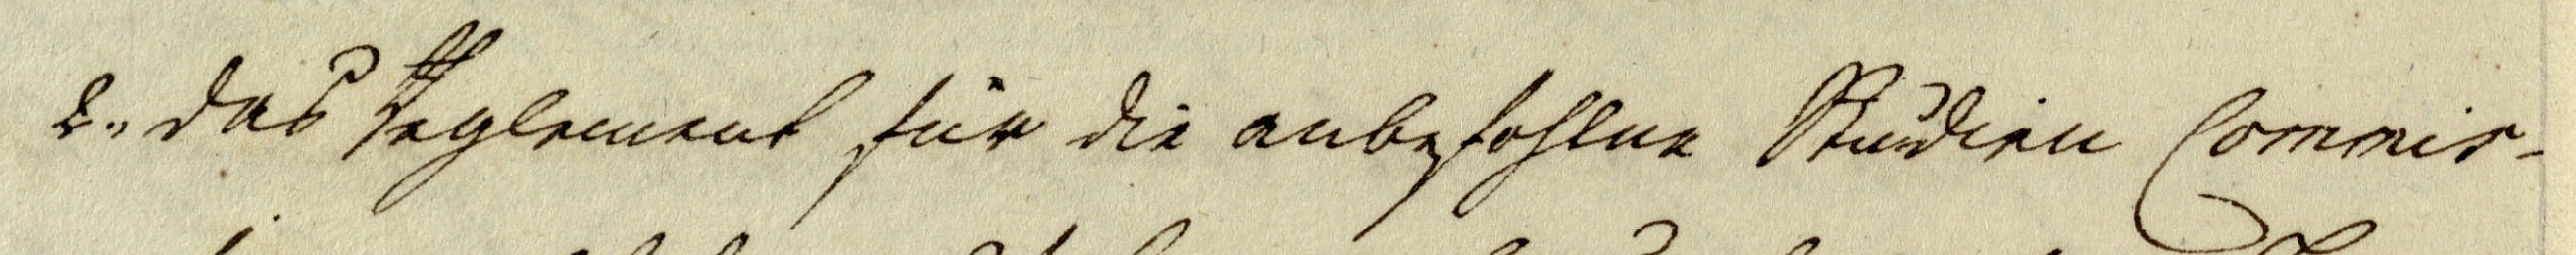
2. das Reglement für die anbefohlne Studien Commis¬
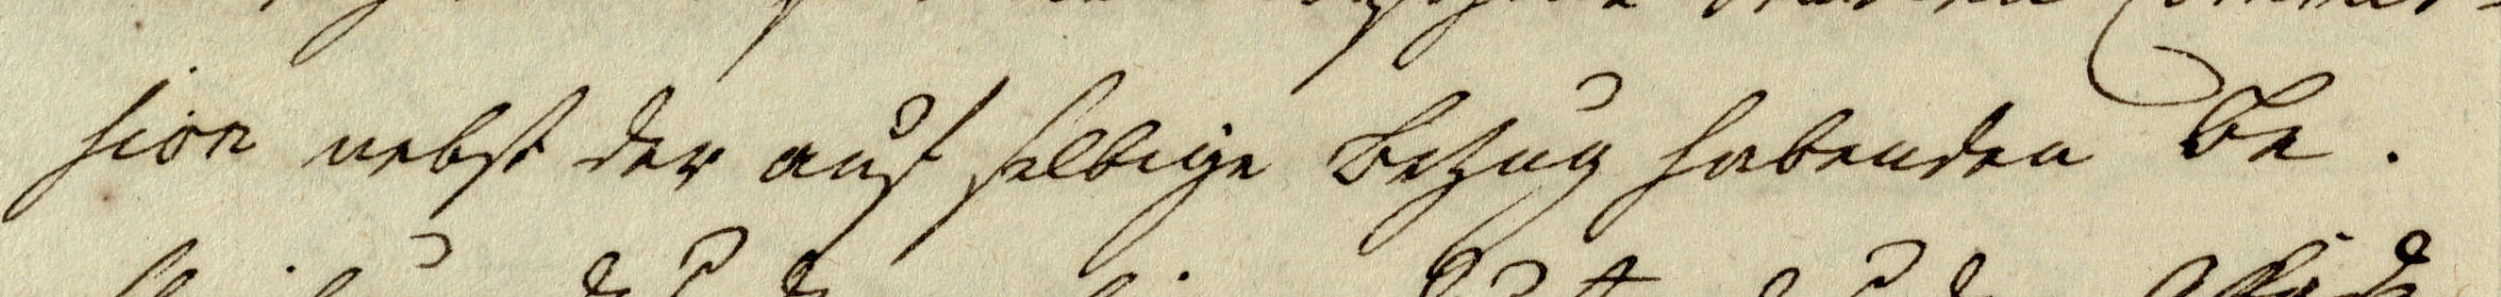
sion nebst der auf selbige Bezug habenden Be¬
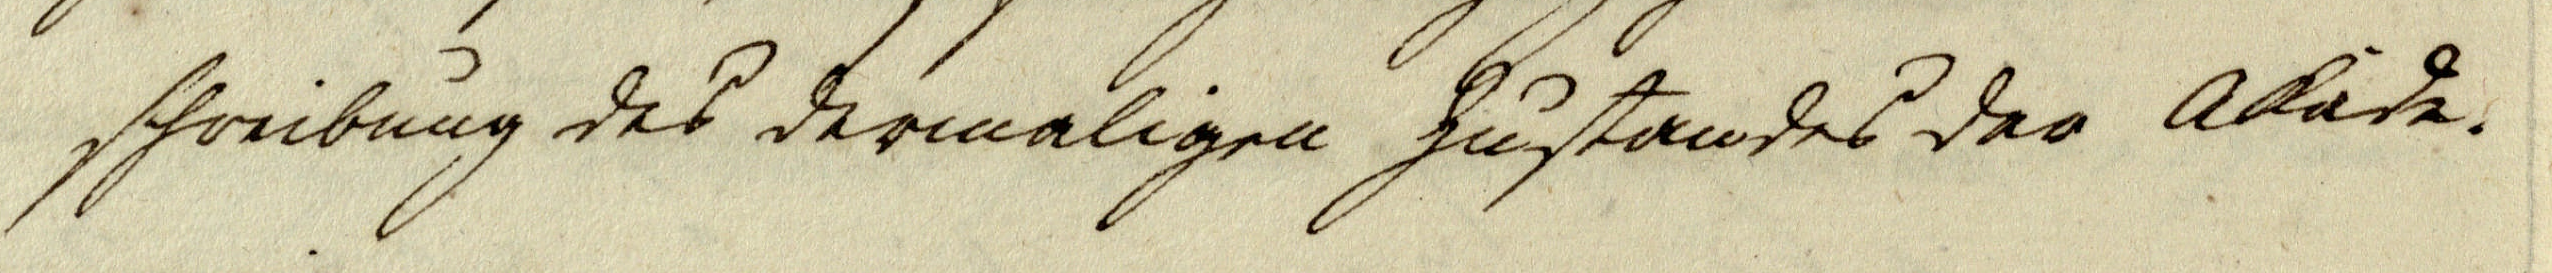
schreibung des dermaligen Zustandes der Akade¬
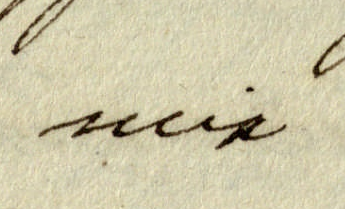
mie
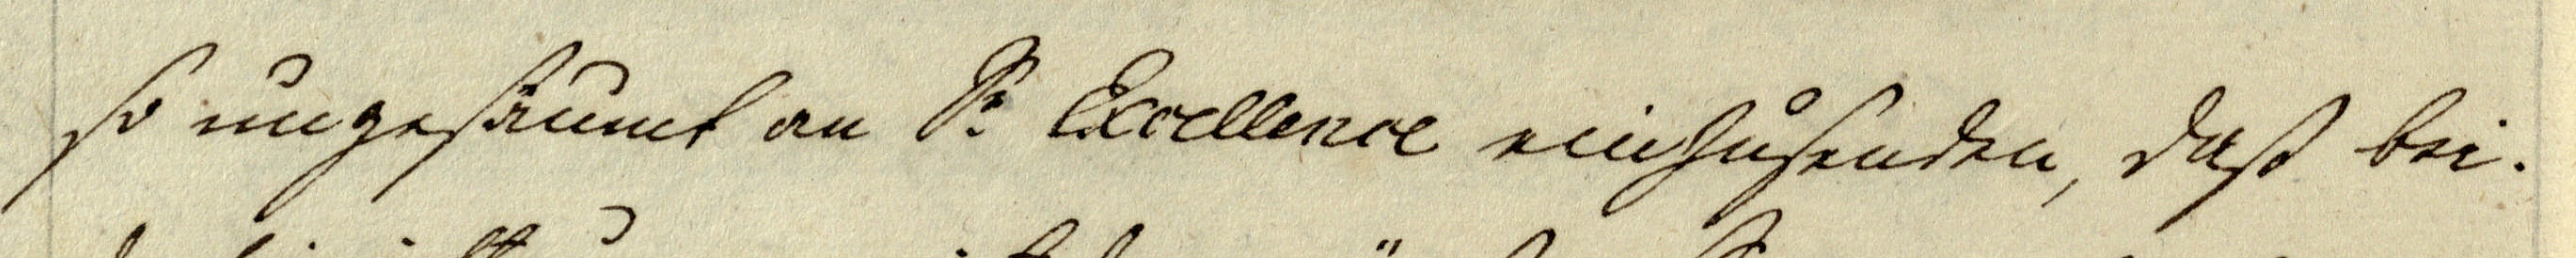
so ungesäumt an Sr Excellence einzusenden, daß bei¬
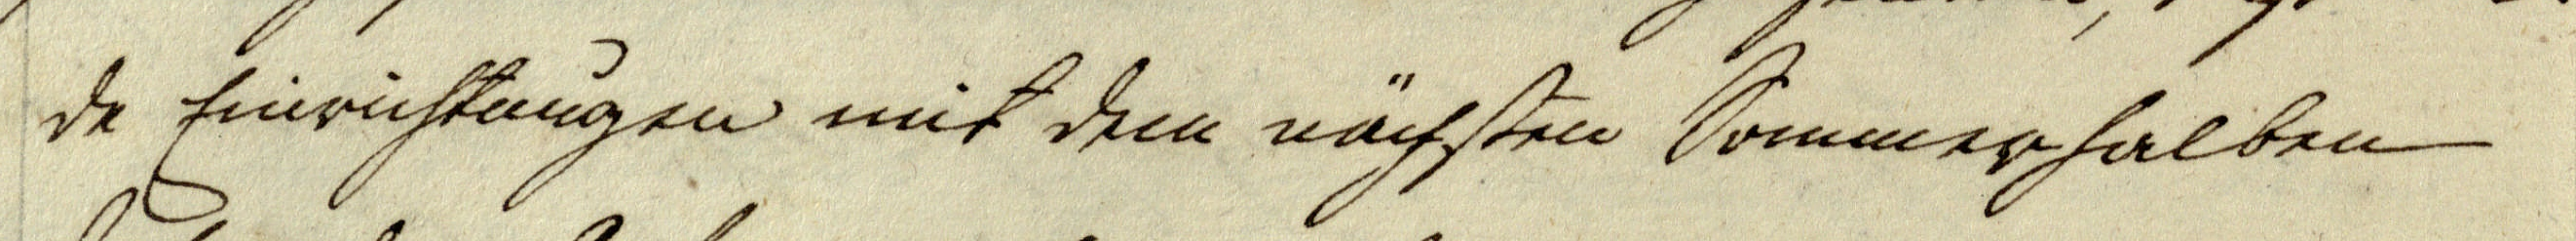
de Einrichtungen mit dem nächsten Sommerhalben
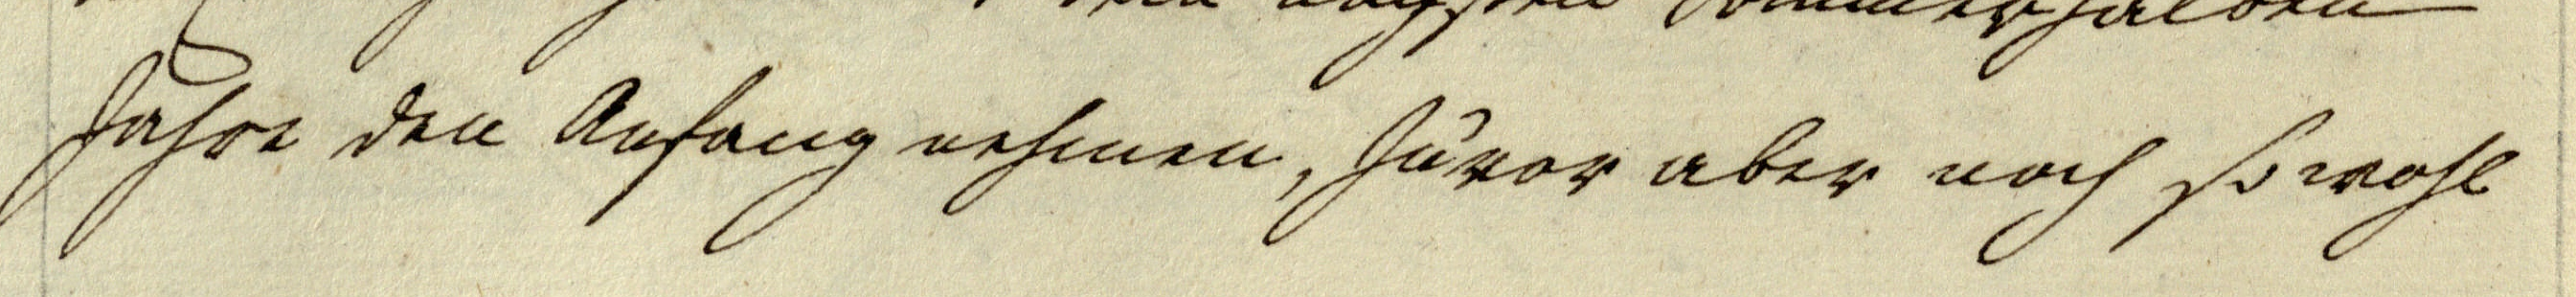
Jahre den Anfang nehmen, zuvor aber noch so wohl
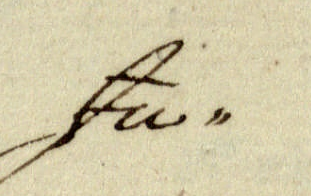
Im
